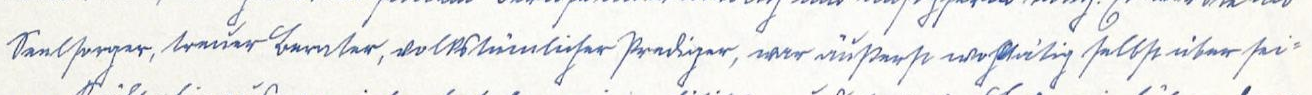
Seelsorger, treuer Berater, volkstümlicher Prediger, war äußerst wohltätig selbst über sei-
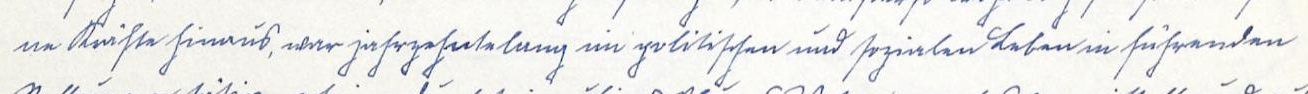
ne Kräfte hinaus, war jahrzehntelang im politischen und sozialen Leben in führenden
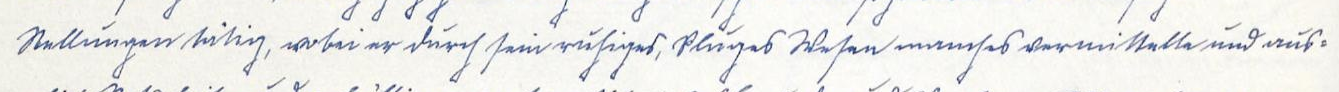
Stellungen tätig, wobei er durch sein ruhiges, kluges Wesen manches vermittelte und aus-
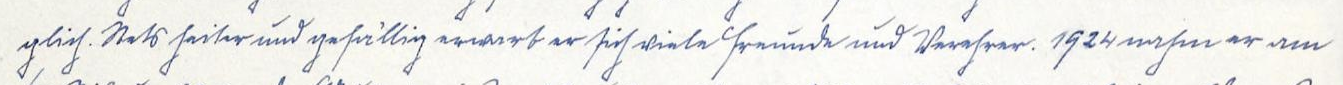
glich. Stets heiter und gefällig erwarb er sich viele Freunde und Verehrer. 1926 nahm er am
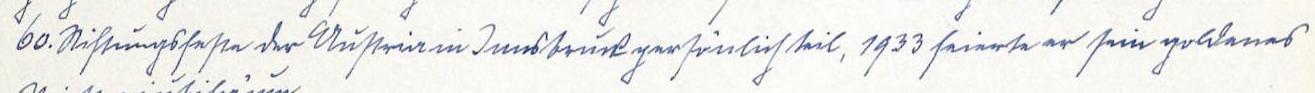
60. Stiftungsfeste der Austria in Innsbruck persönlich teil, 1933 feierte er sein goldenes
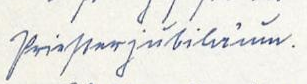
Priesterjubiläum.
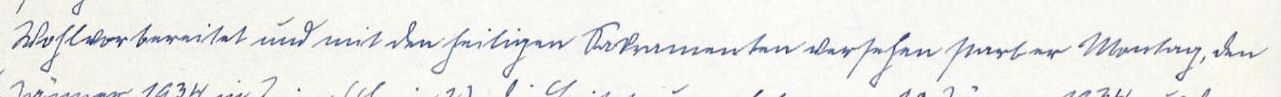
Wohl vorbereitet und mit den heiligen Sakamenten versehen starb er Montag, den
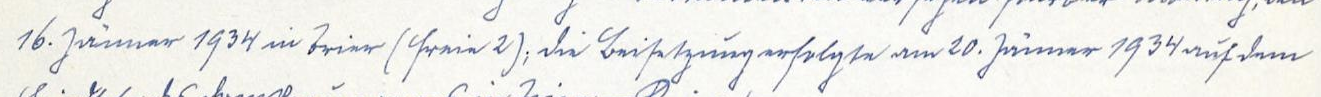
16. Jänner 1934 in Trier (Freie 2), die Beisetzung erfolgte am 20. Jänner 1934 auf dem
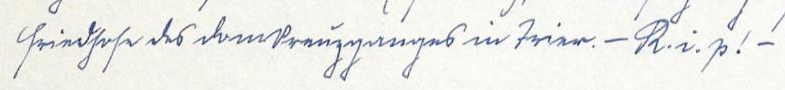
Friedhofe des Domkreuzganges in Trier.- R.i.p.!
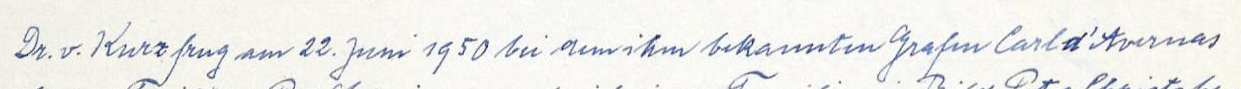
Dr. vor. Kurz frug am 22. Juni 1950 bei dem ihm bekannten Graf Carl d' Avernas
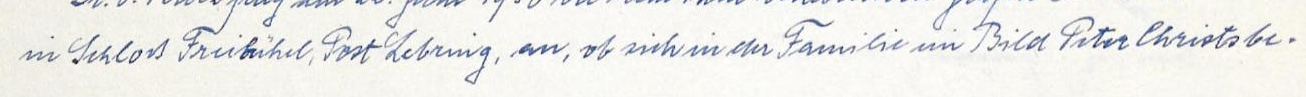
in Schloß Freibühel,Post Lebring an, ob sich in der Familie ein Bild Peter Christs be-
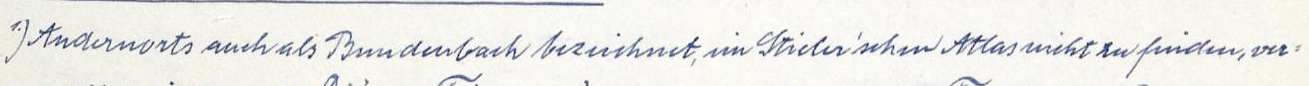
1) Audernorts auch als Bundenbach bezeichnet, im Stieler'schen Atlas nicht zu finden ver-
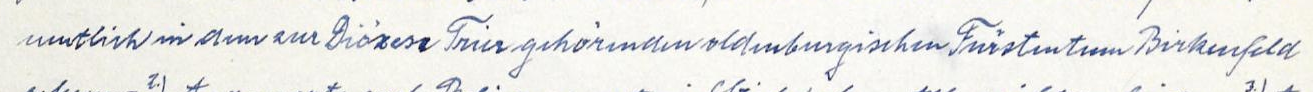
mutlich in dem zur Diözese Trier gehärenden oldenburgischen Fürstentum Birkenfeld
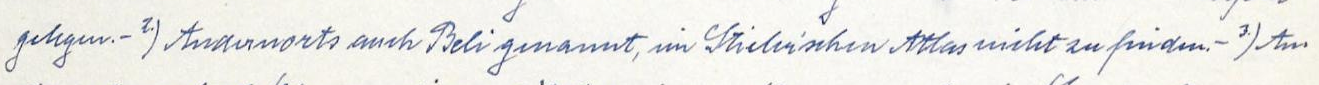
gelegen.- 2) Andernorts auch Beli genannt, im Stieler'schen Atlas nicht zu finden.- 3) An-
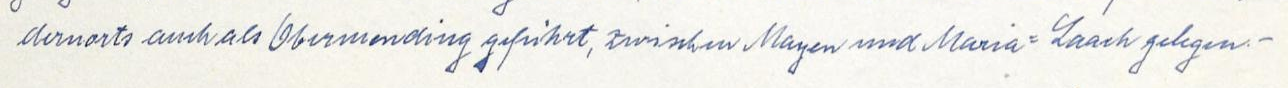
dernorts auchals Obermending geführt, zwischen Mayetragen und Maria- Lazch geegent.-
